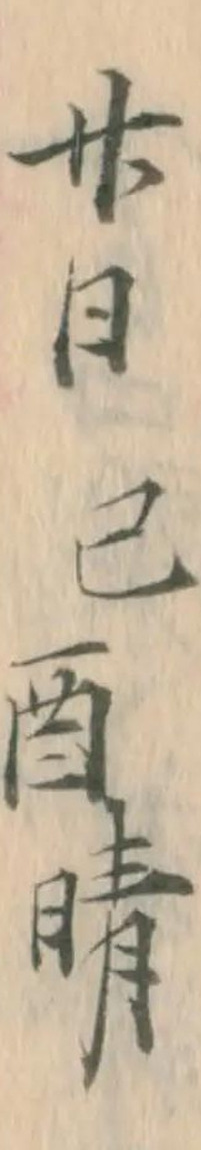廿日己酉晴

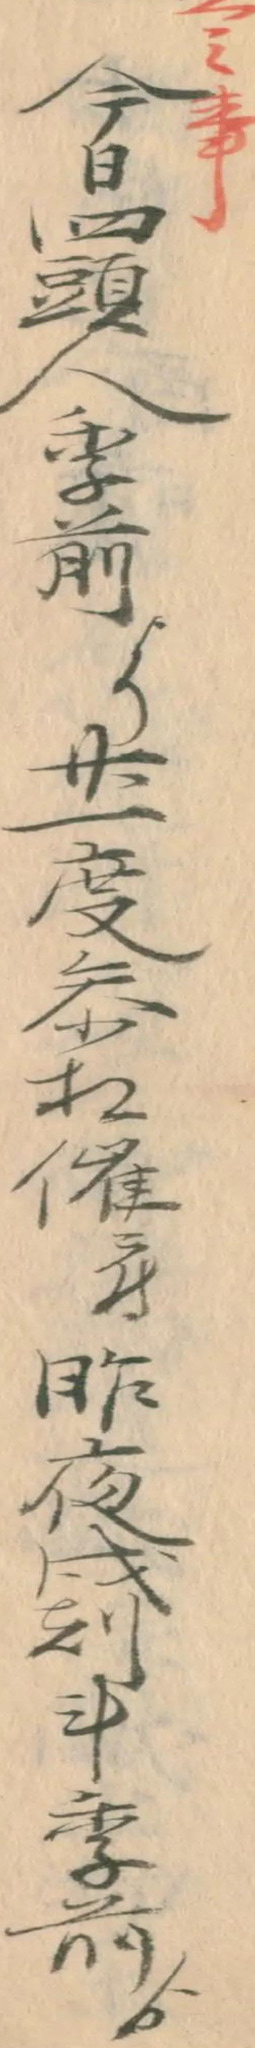一今日四頭人季前より廿一度参社催ニ付昨夜戌刻斗季前ゟ
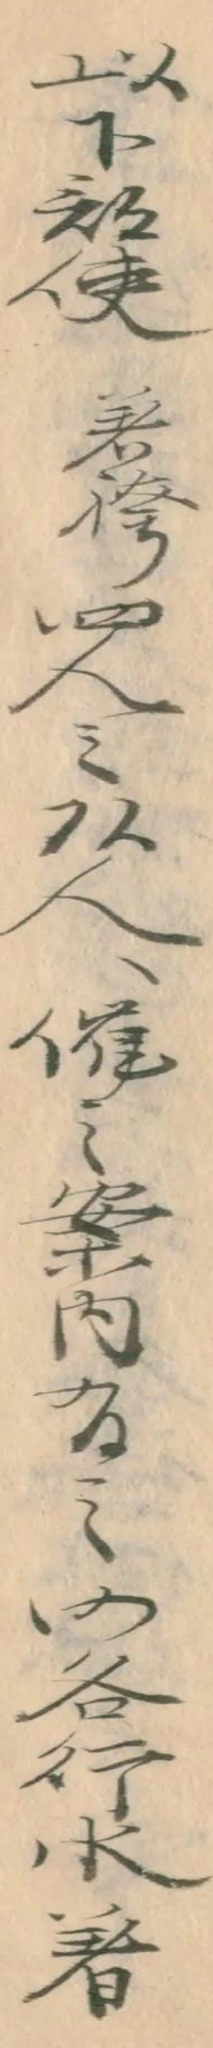以下部使着袴四人之頭人へ催之案内有之仍各行水着
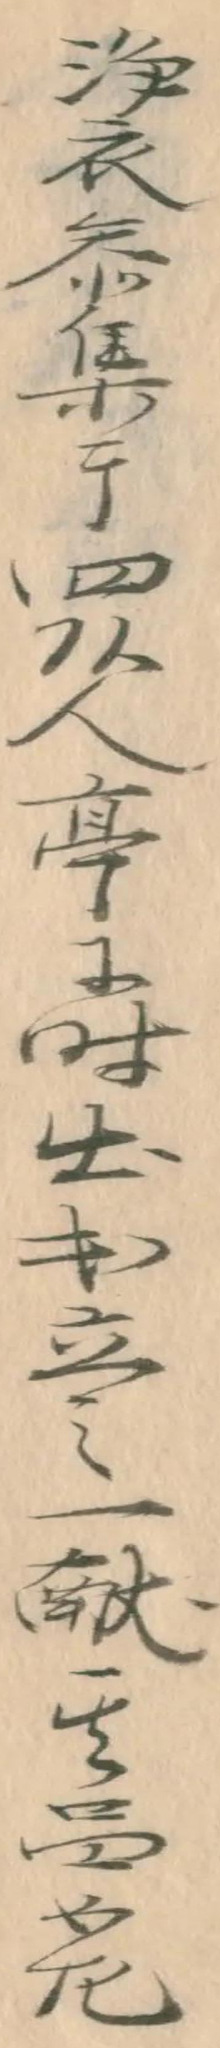浄衣参集于四頭人亭于時出本立之一献其品如左
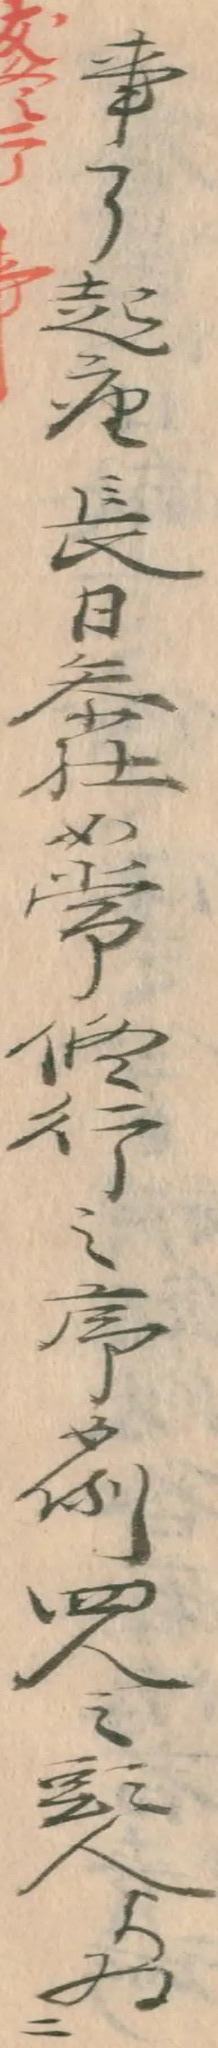事了起座長日参社如常修行之序如例四人之頭人より為
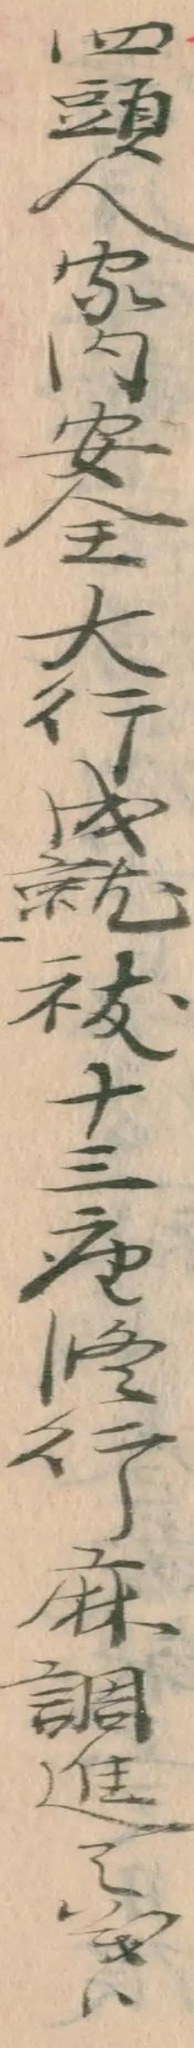四頭人家内安全大行成就祓十三座修行麻調進之儀ハ
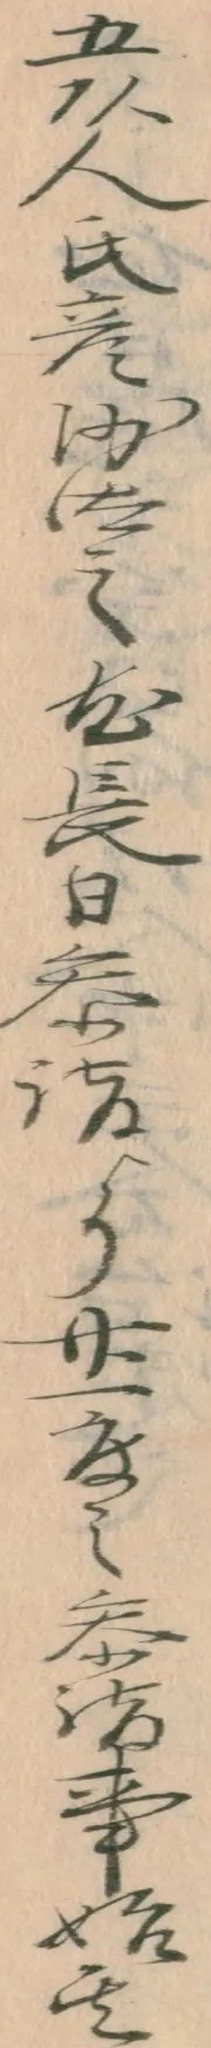五頭人氏彦沙汰之尤長日参詣より廿一度之参詣事始其
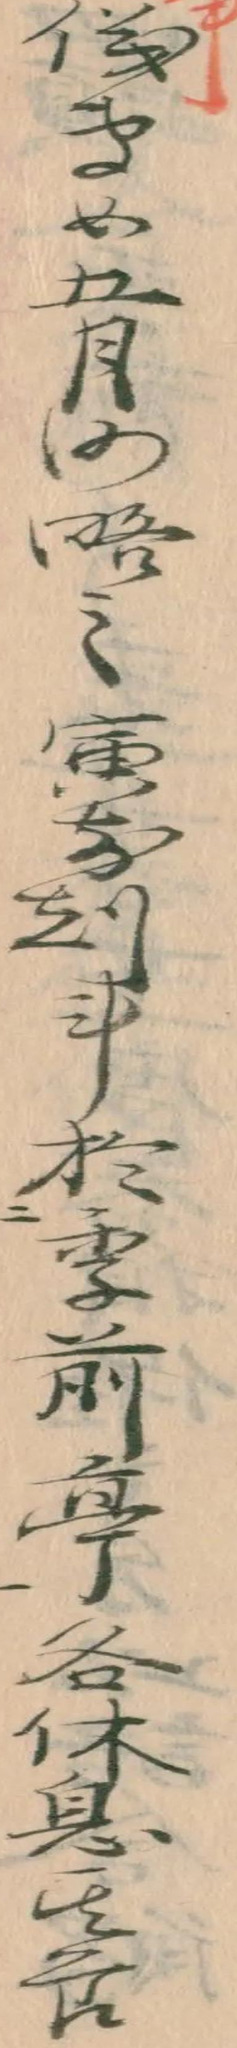儀専如五月仍略之寅前刻斗於季前亭各休息其節
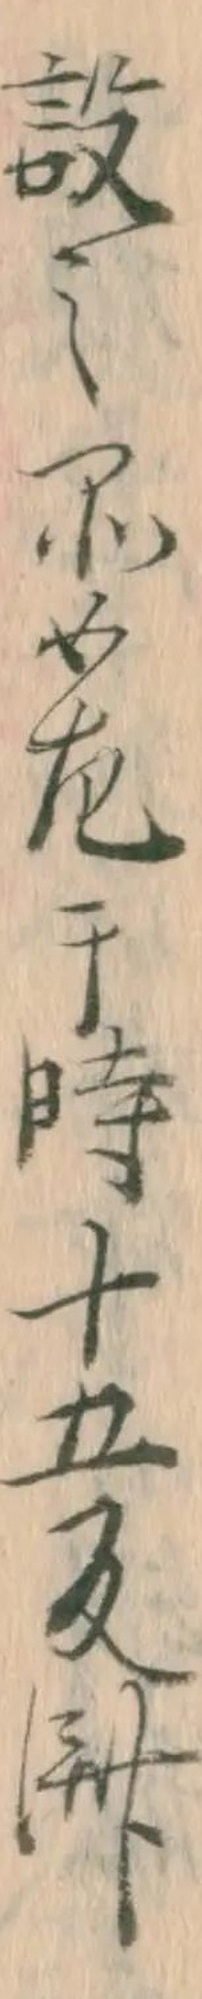設之品如左其時十五反済
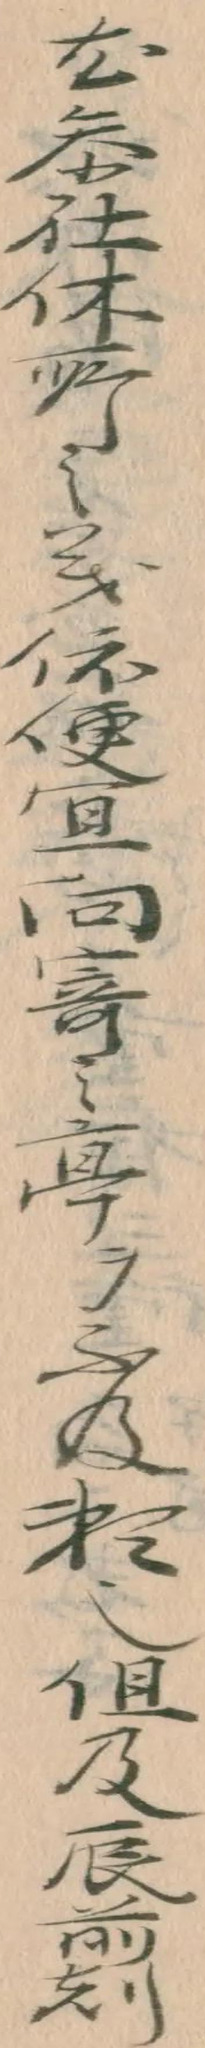尤参社休所之義依便宜向寄之亭ヲ不及頼之但及辰前刻
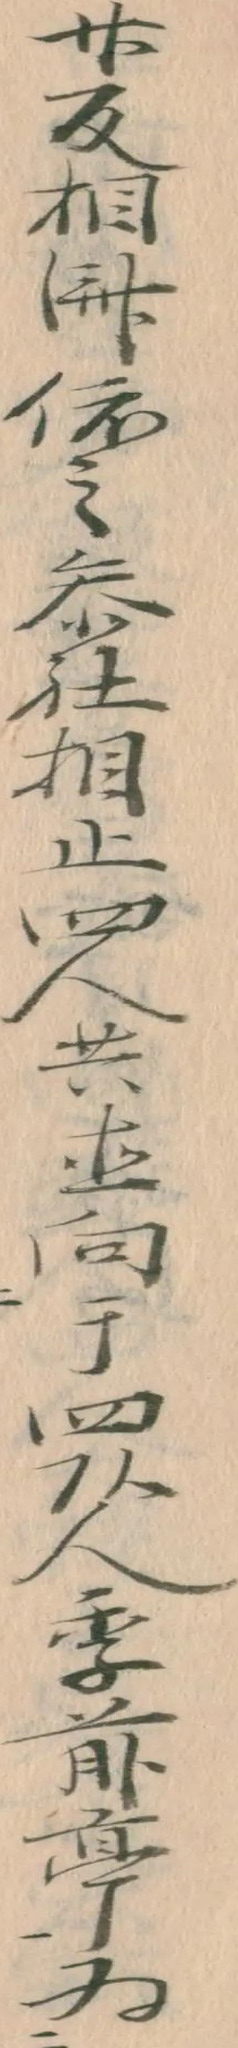廿反相済依之参社相止四人共直向于四頭人季前亭為
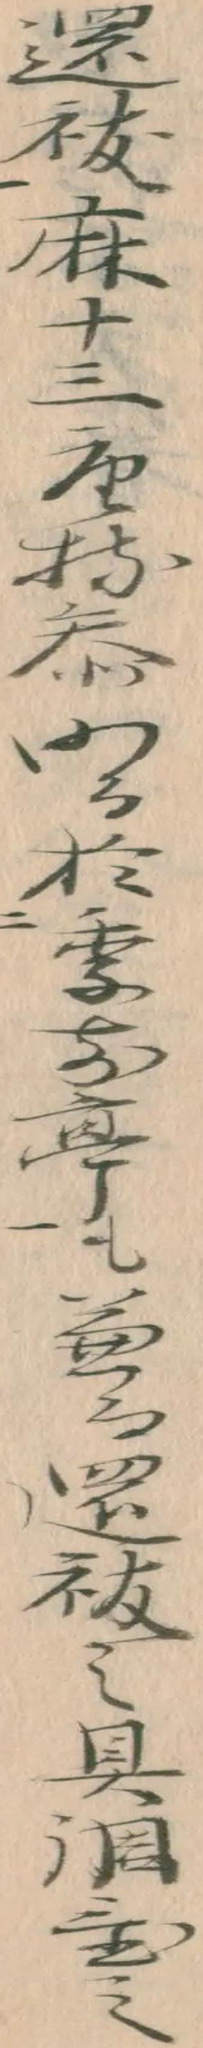還祓麻十三座持参仍而於季前亭も兼而還祓之具調置之
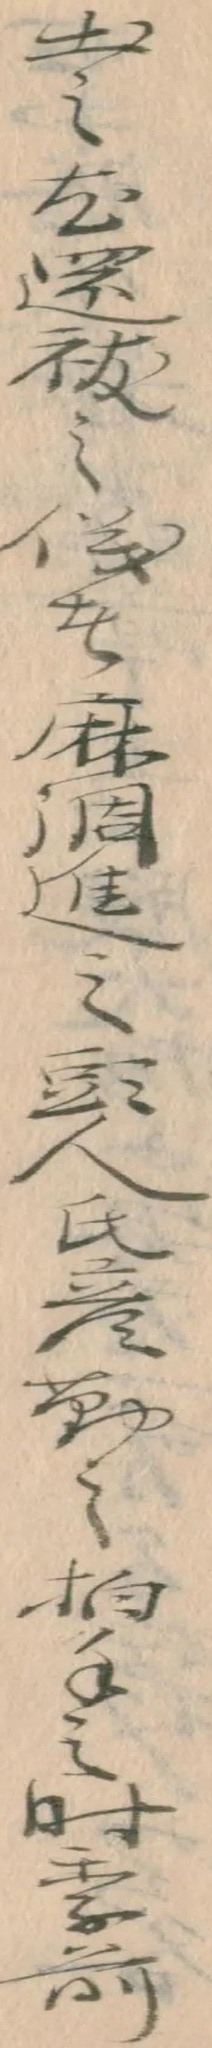出之尤還祓之儀は麻調進之頭人氏彦勤之拍手之時季前
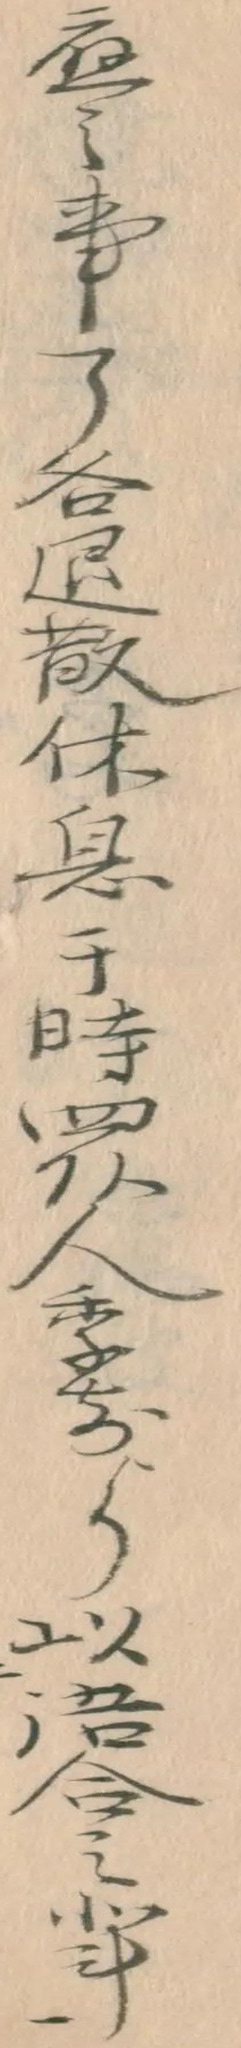應之事了各退散休息于時四頭人季前より以語合之輩
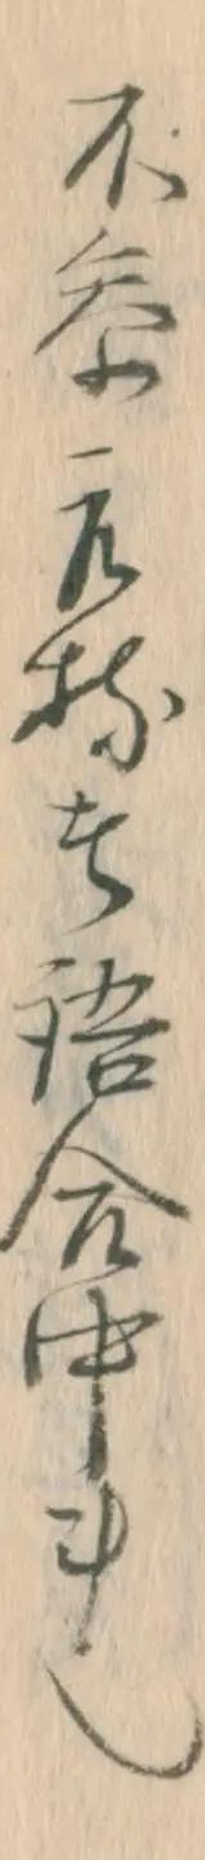不参取持者語合中斗也
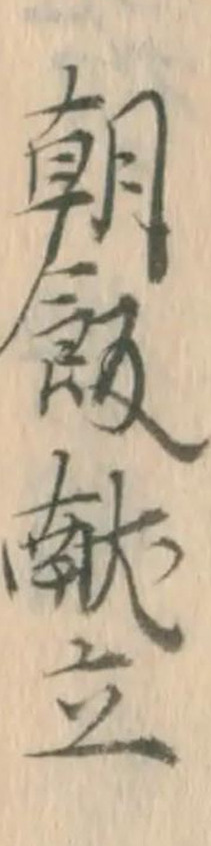朝飯献立
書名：賀茂社記録. 第74冊
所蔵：国立国会図書館 National Diet Library, JAPAN
